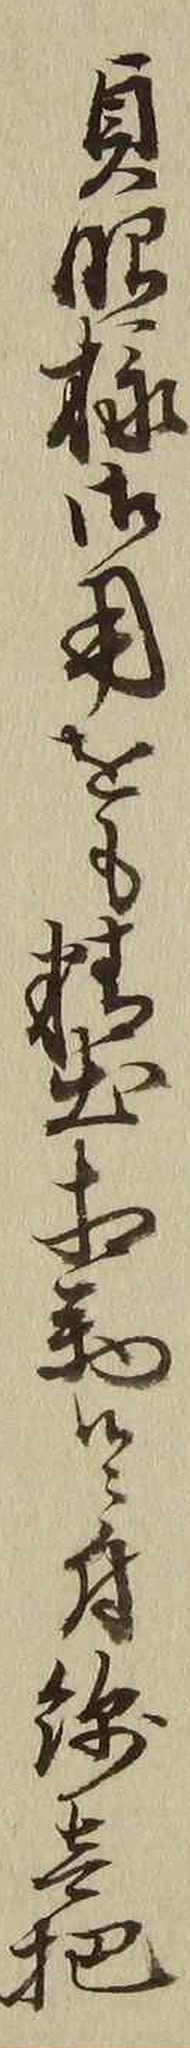貞昭様御用をも精出相勤候ニ付綿壱把
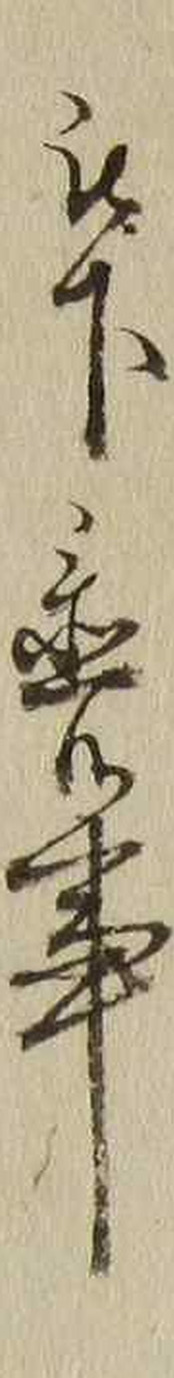被下置候事
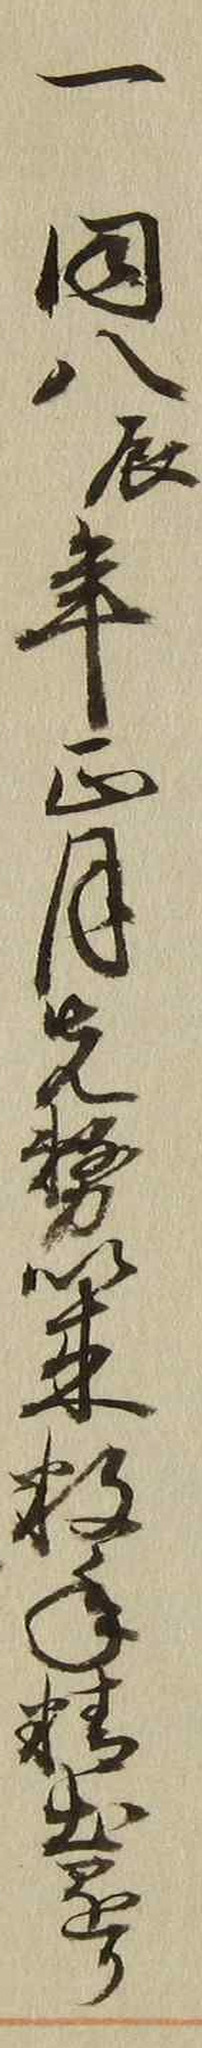一同八辰年正月先努以来数年精出懸り
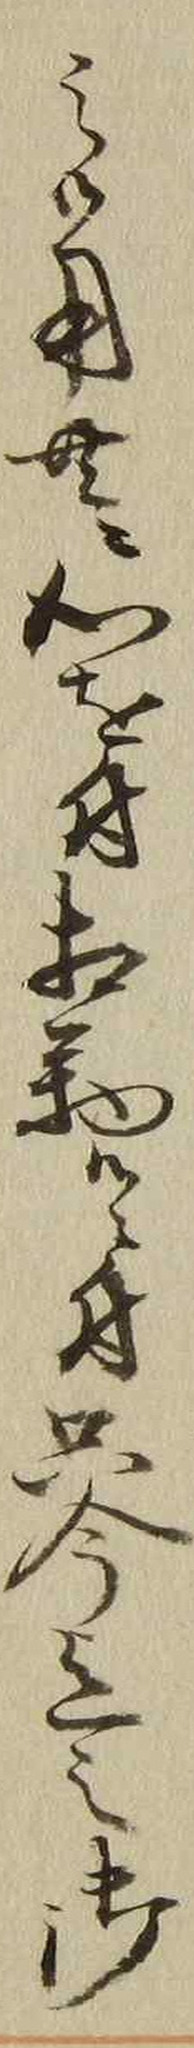之御用共ニ心を付相勤候ニ付只今迄之御
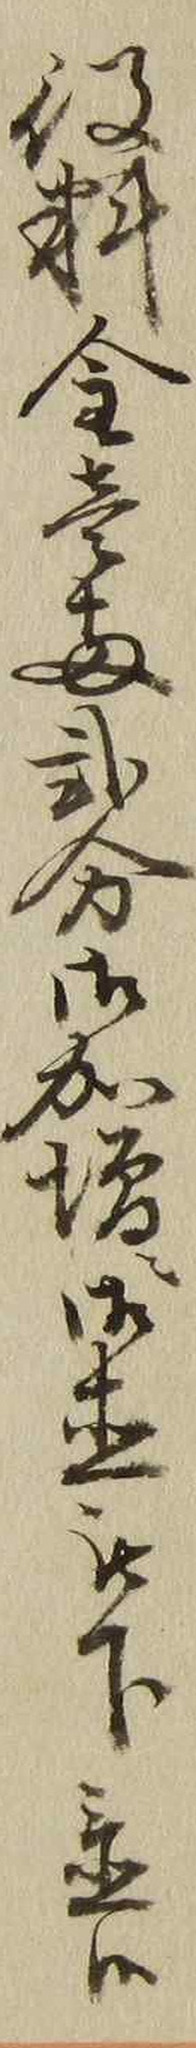役料金壱両弐分御加増御直被下置候

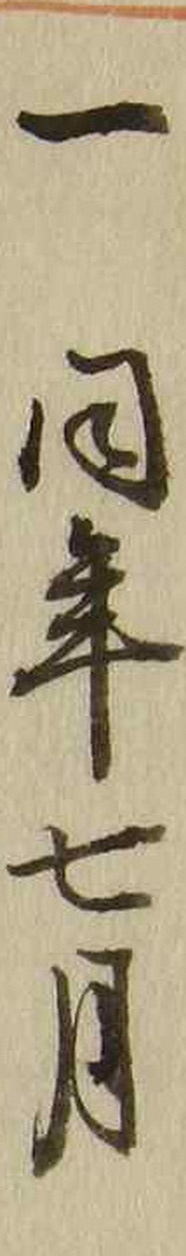一同年七月
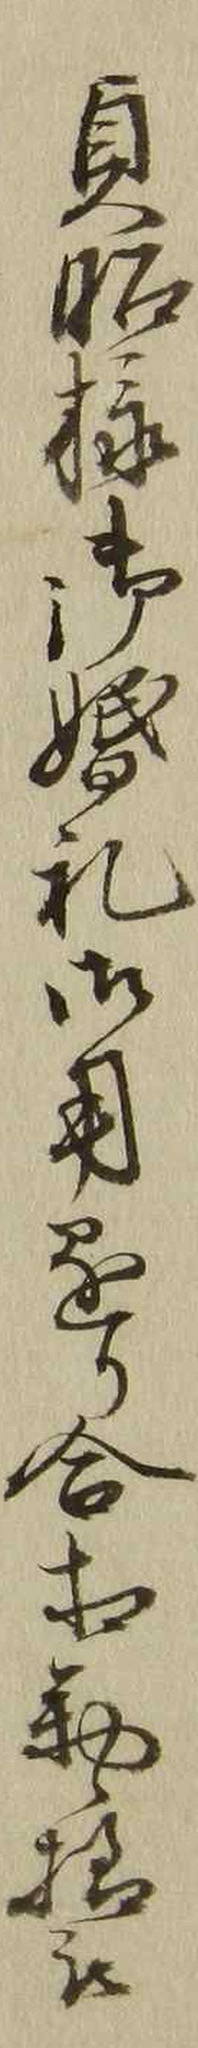貞昭様御婚礼御用懸り合相勤候様被
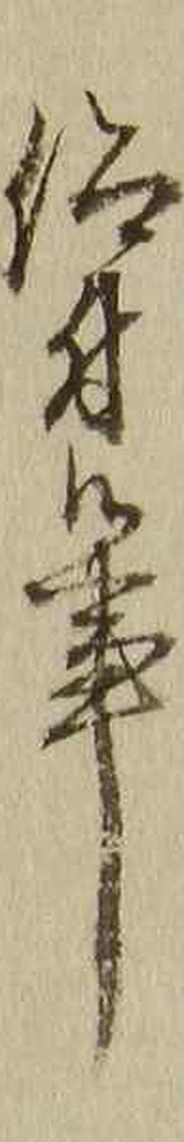仰付候事
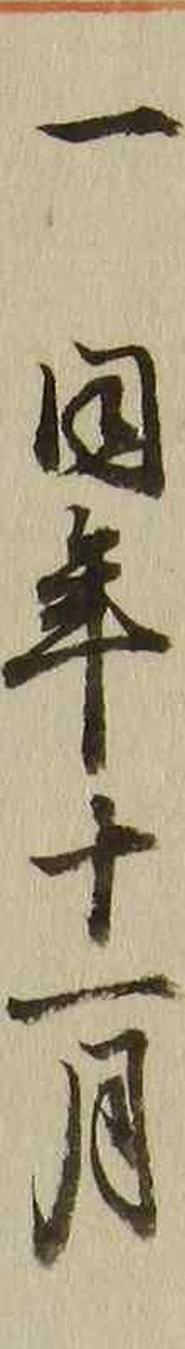一同年十一月
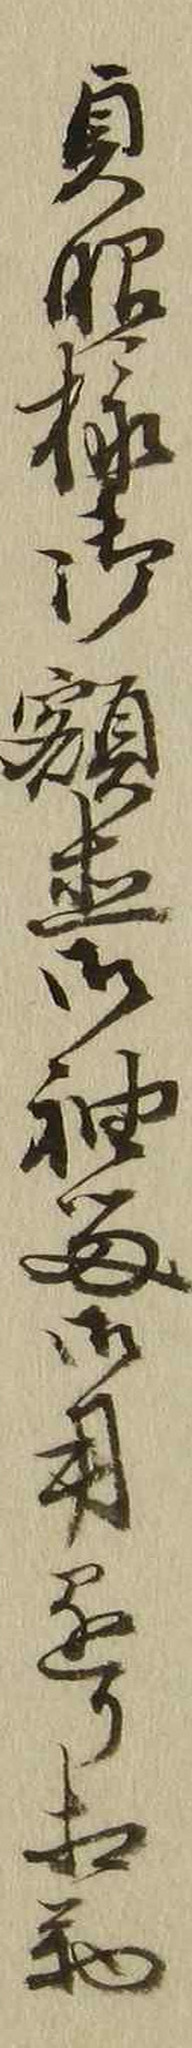貞昭様御額直御袖留御用懸り相勤
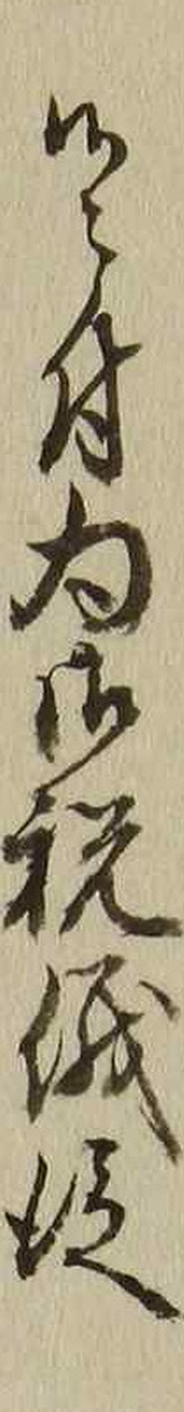候ニ付為御祝儀従
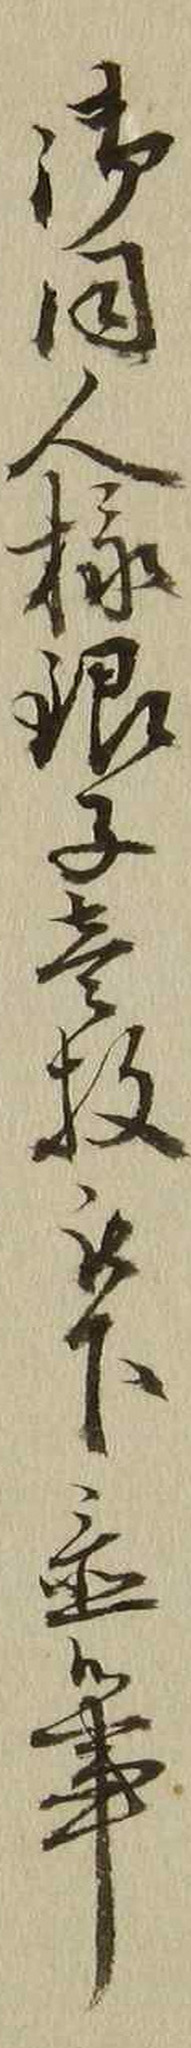御同人様銀子壱枚被下置候事
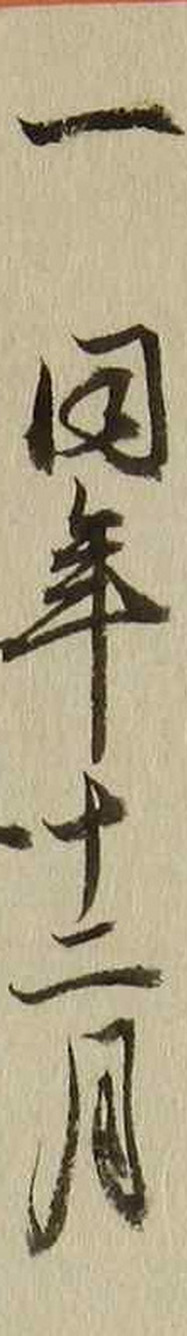一同年十二月
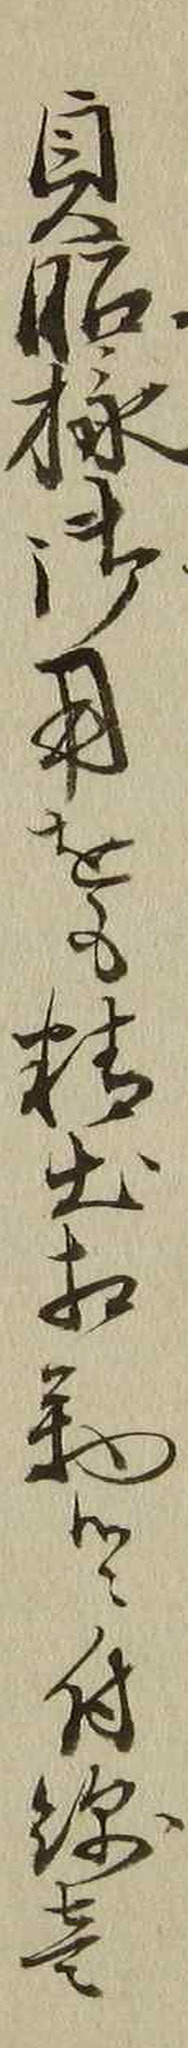さだ貞昭様御用をも精出相勤候ニ付綿壱
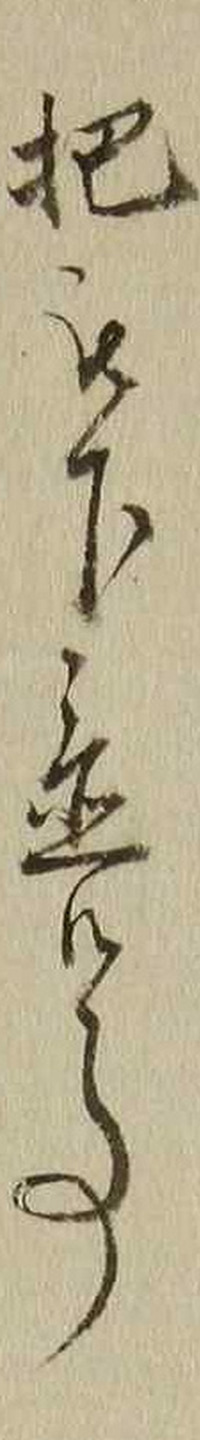把被下置候事
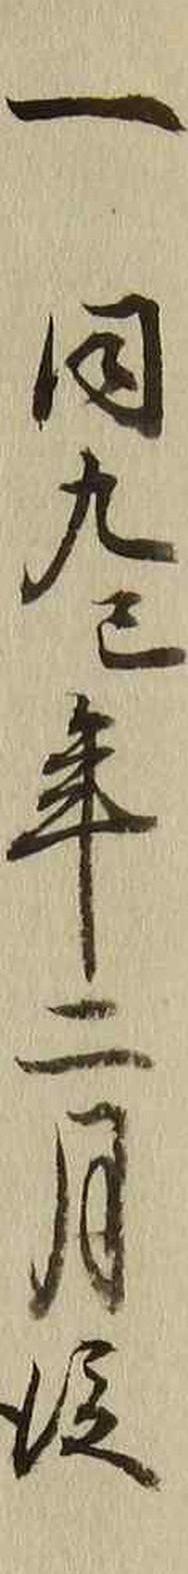一同九巳年二月従
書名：諸士系譜　巻之64　と之部7
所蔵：会津若松市立会津図書館
